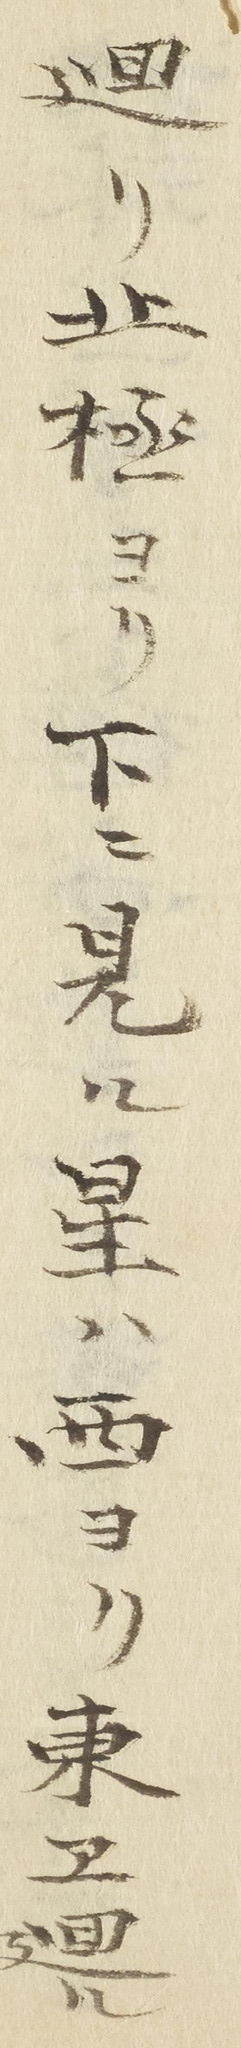廻リ北極ヨリ下ニ見ル星ハ西ヨリ東ヱ廻ル
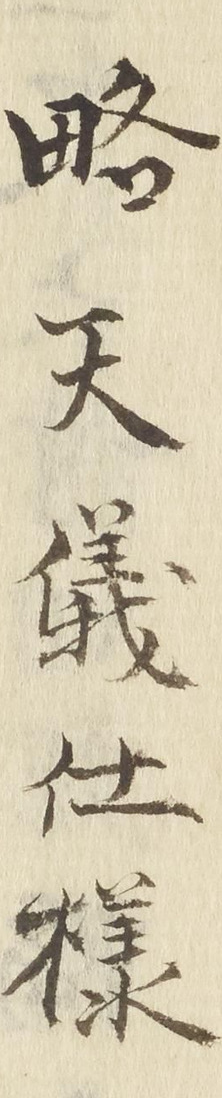略天儀仕様

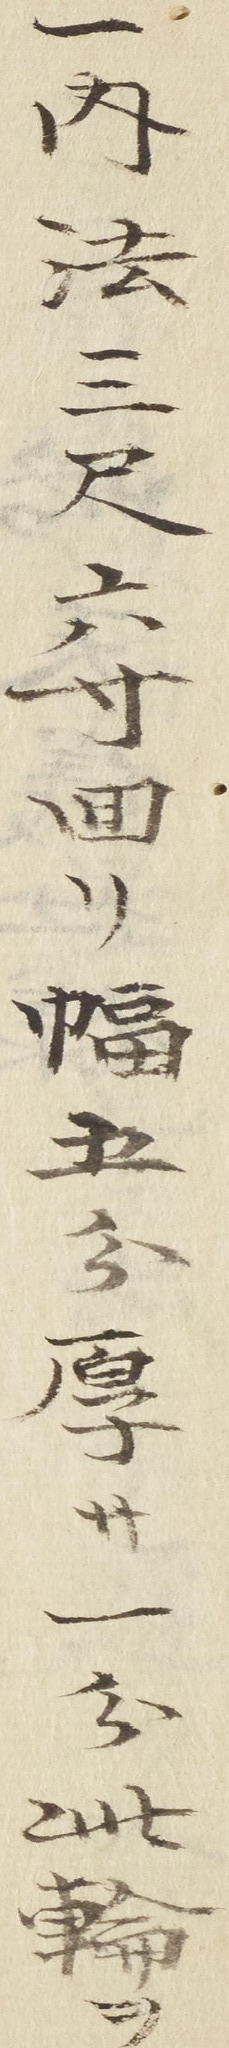一内法三尺六寸回リ幅五分厚サ一分此輪ヲ
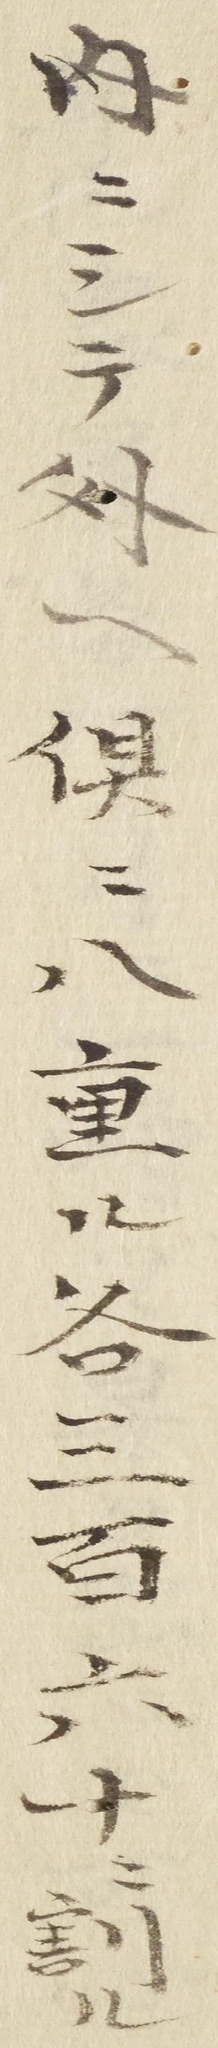内ニシテ外ヘ倶ニ八重ル各三百六十ニ割ル
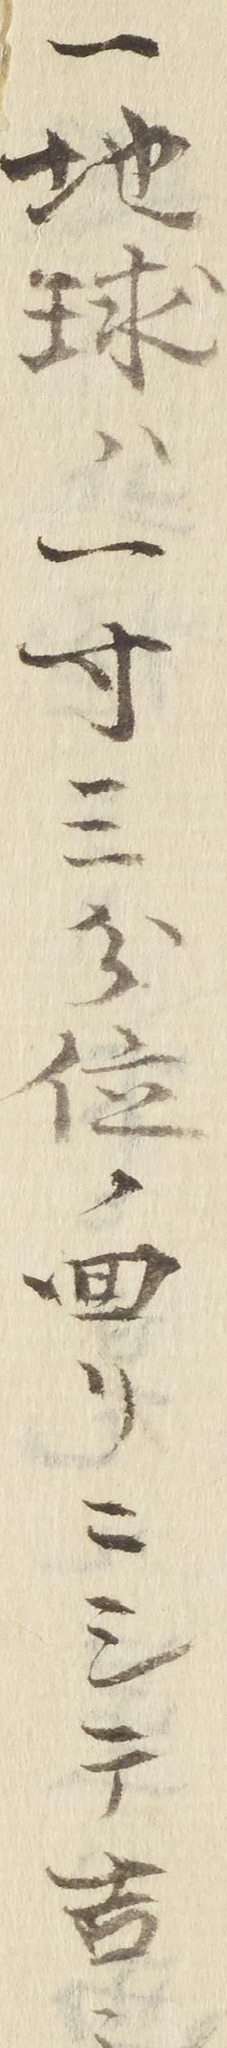一地球ハ一寸三分位ノ回リにして吉シ
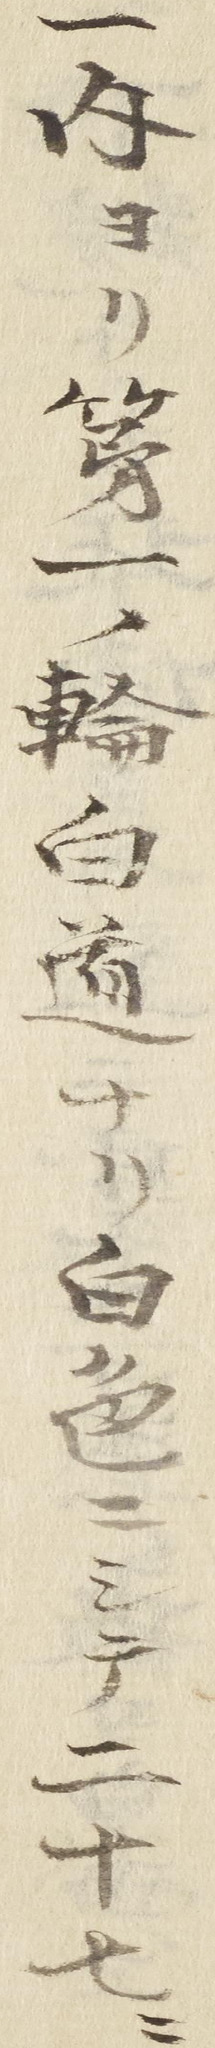一内ヨリ第一ノ輪白道ナリ白色ニシテ二十七ニ
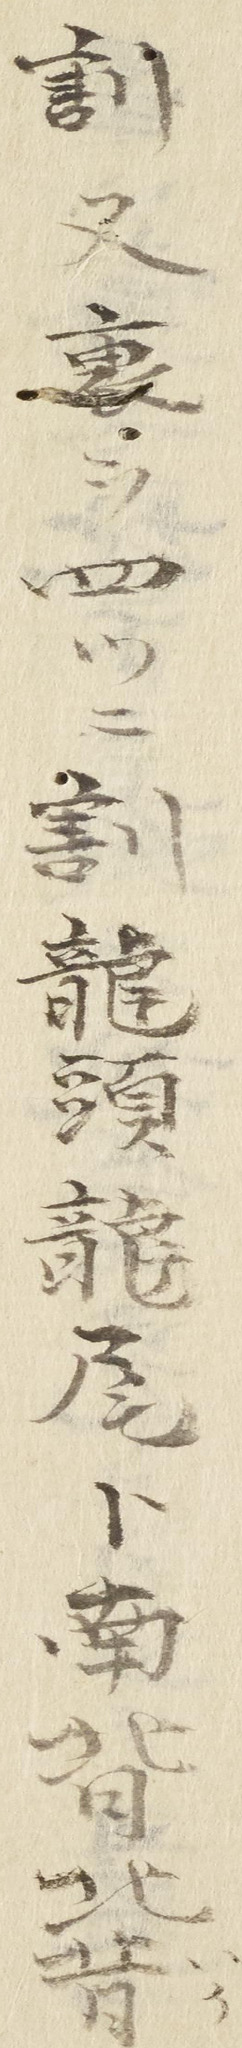割又裏ヲ四ツニ割龍頭龍尾ト南背北背
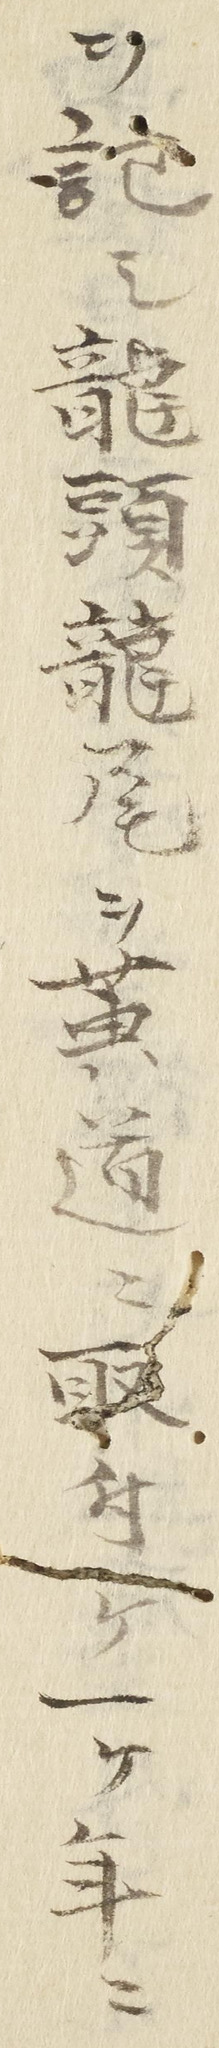ヲ記シ龍頭龍尾ヲ黄道ニ取付ケ一ヶ年ニ
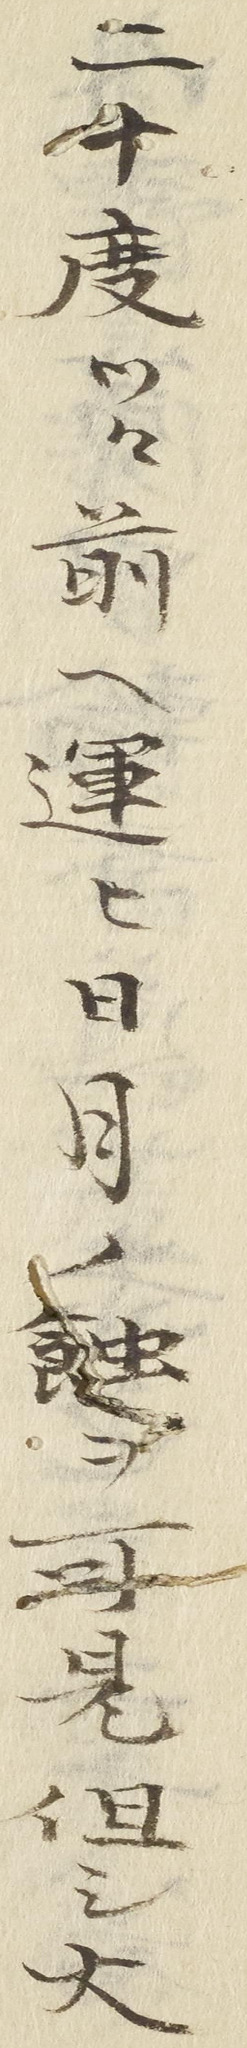二十度ツ々前ヘ運ヒ日月ノ蝕ヲ可見但シ大
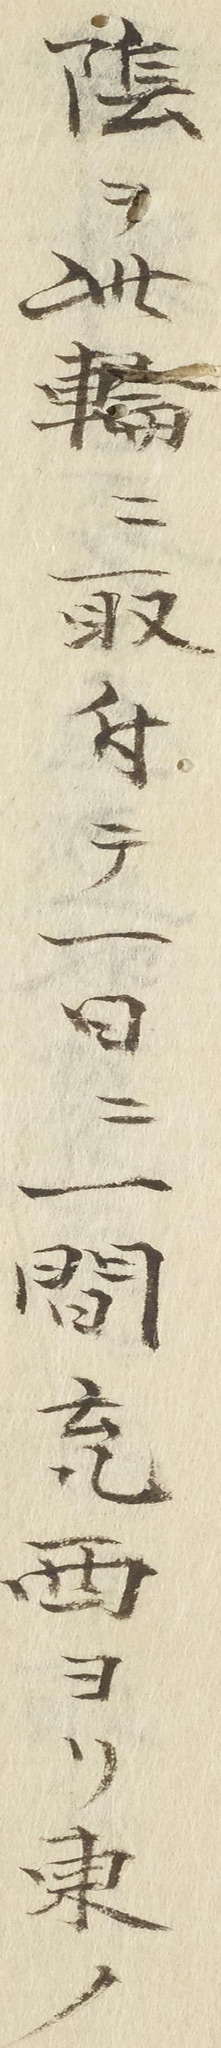陰ヲ此輪ニ取付テ一日ニ一間充西ヨリ東ノ
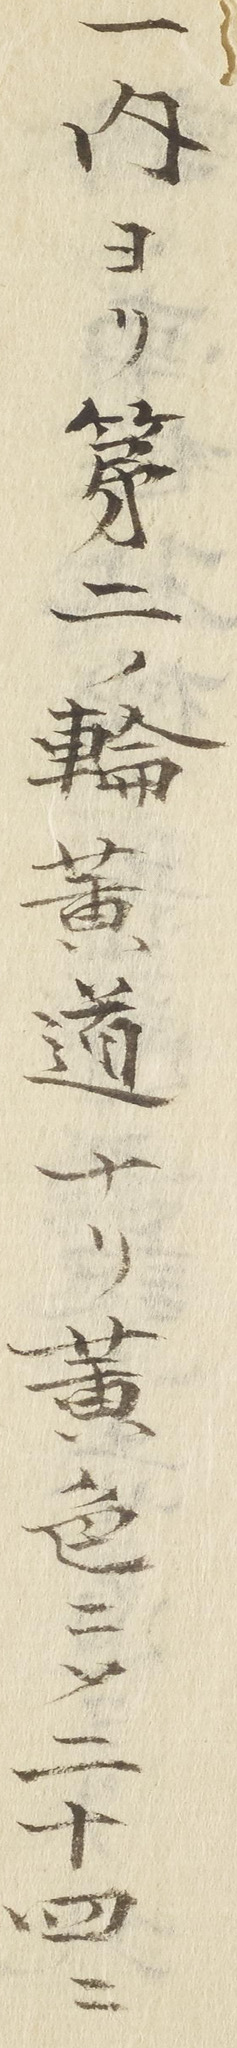一内ヨリ第二ノ輪黄道ナリ黄色ニシテ二十四ニ
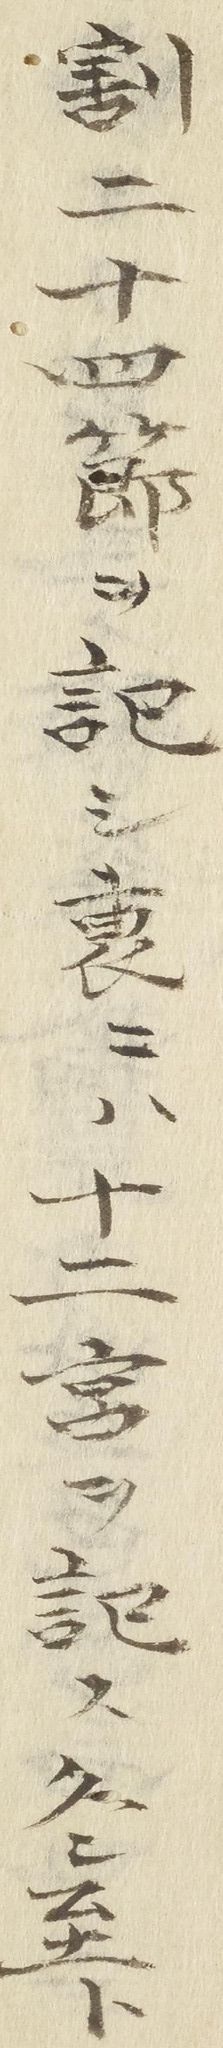割二十四節ヲ記シ裏ニハ十二宮ヲ記ス冬至ト
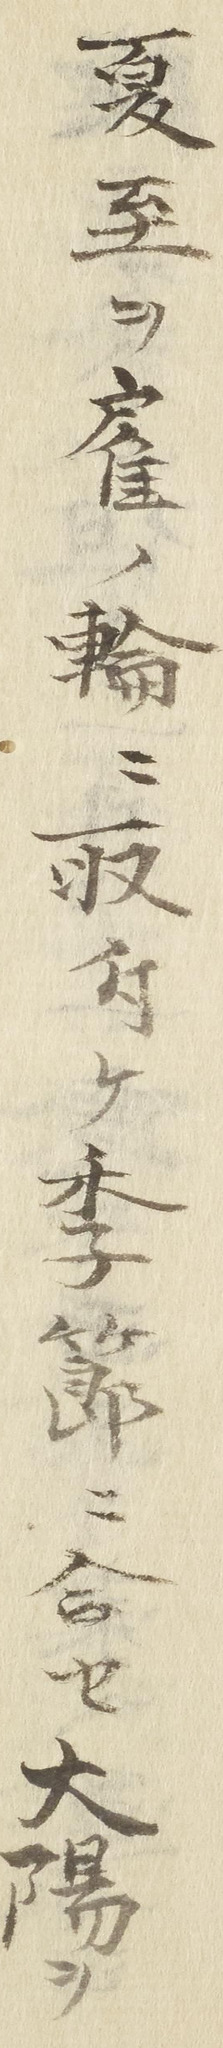夏至ヲ雇ノ輪ニ取付季節ニ合セ大陽ヲ

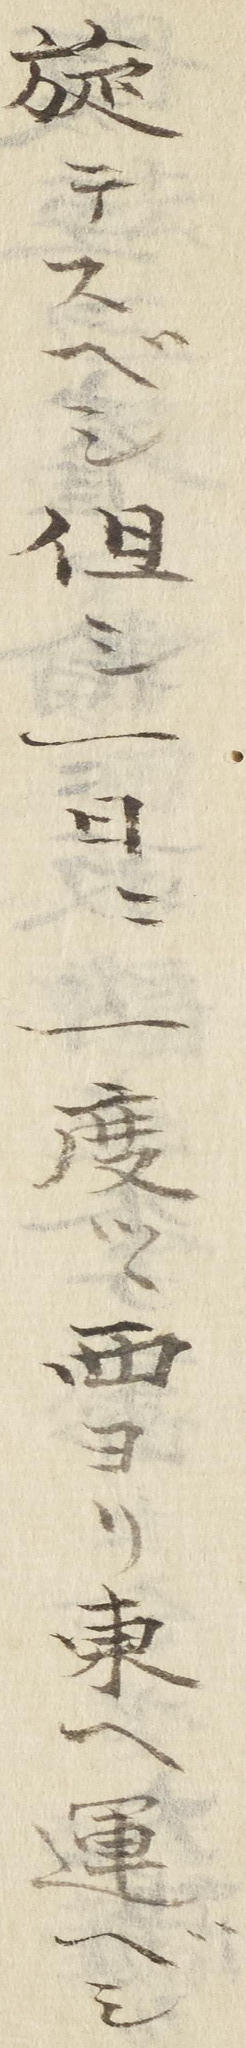旋テスベシ但シ一日ニ一度ツヽ西ヨリ東へ運ベシ
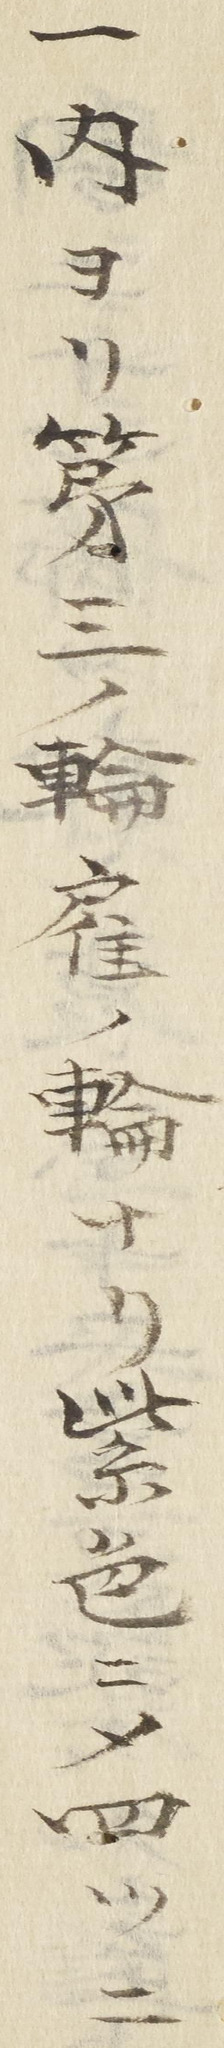一内ヨリ第三ノ輪雇ノ輪ナリ紫色ニシテ四ツニ
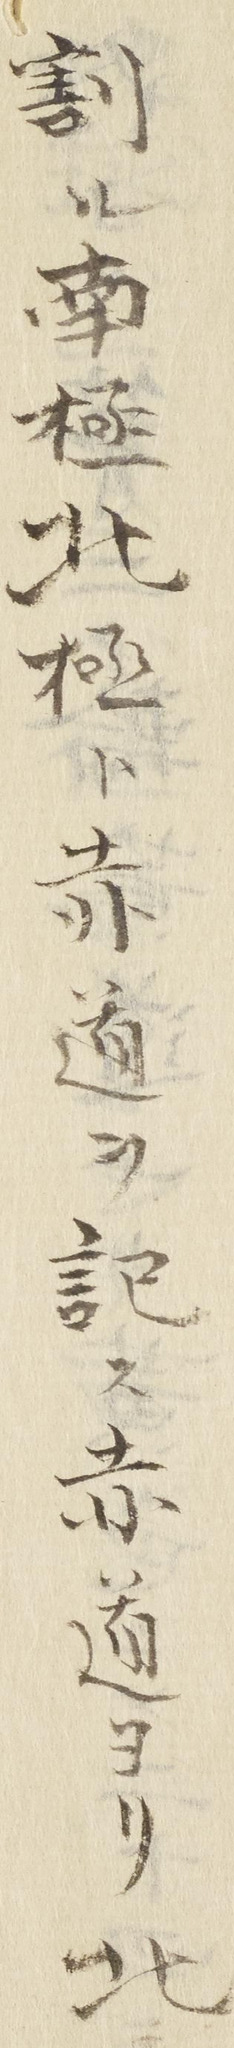割ル南極北極ト赤道ヲ記ス赤道ヨリ北
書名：天象話説
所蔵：東京大学地震研究所図書室 Earthquake Research Institute Library, The University of Tokyo, JAPAN
